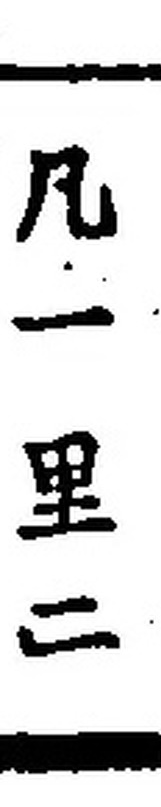凡一里二
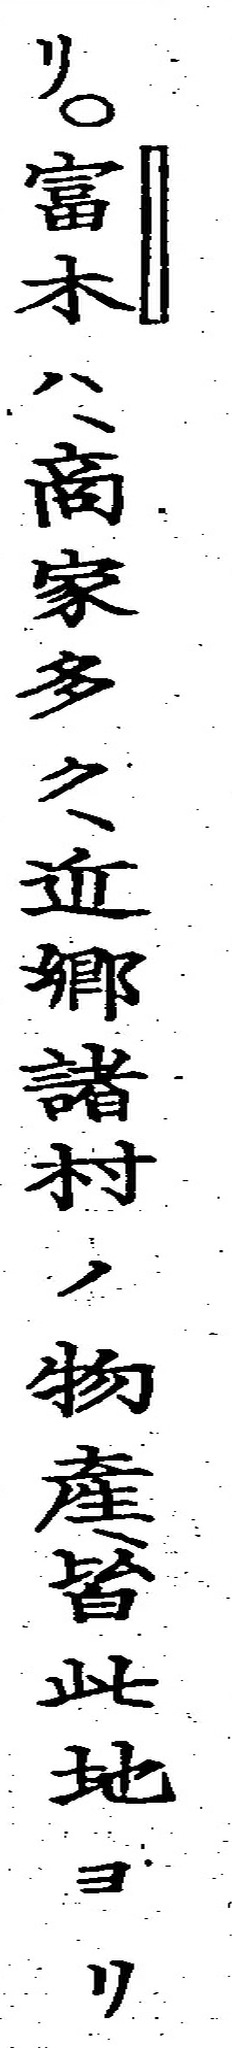リ。富木ハ、商家多ク、近郷諸村ノ物産、皆此地ヨリ
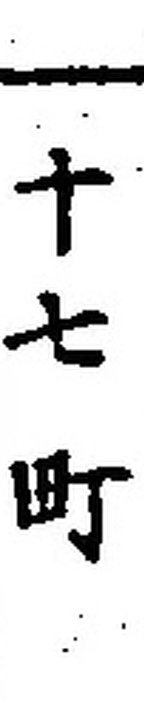十七町
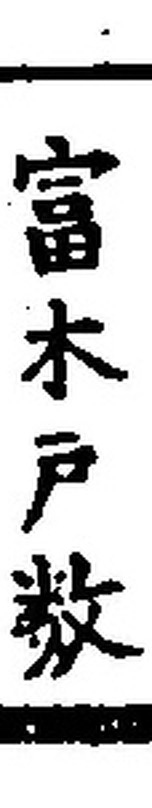富木戸数
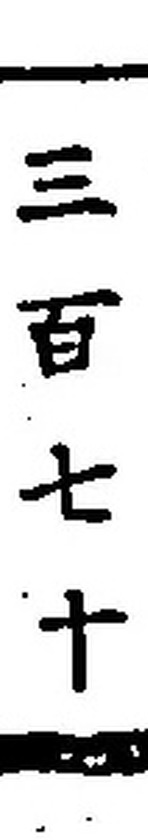三百七十
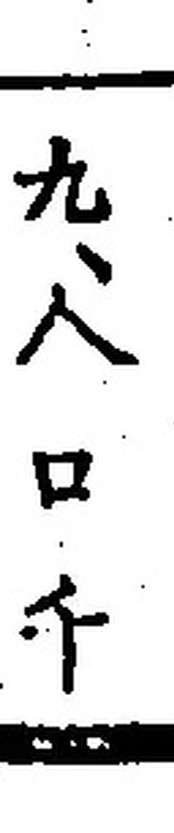九、人口千
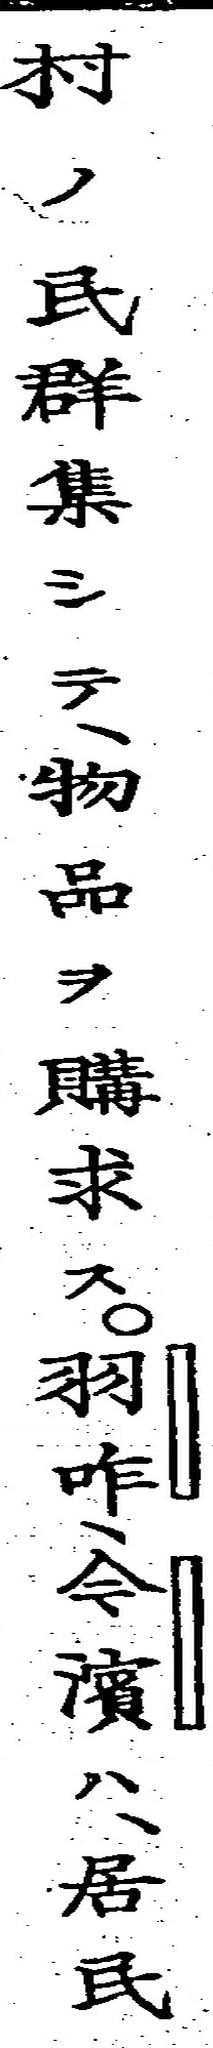村ノ民群集シテ、物品ヲ購求ス。羽咋・今浜ハ、居民
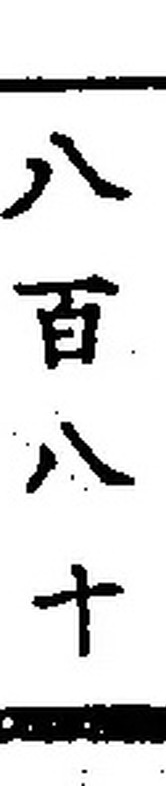八百八十
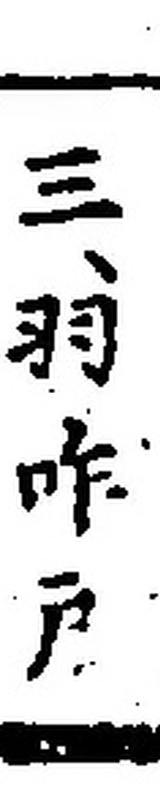三、羽咋戸
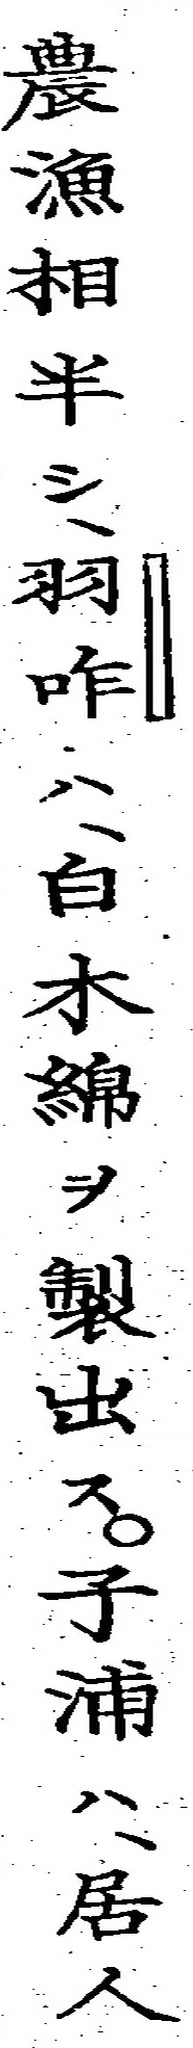農漁相半シ、羽咋ハ、白木綿ヲ製出ス。子浦ハ、居人
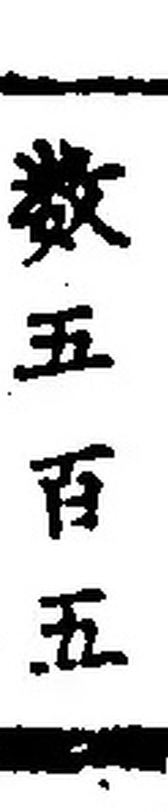数五百五
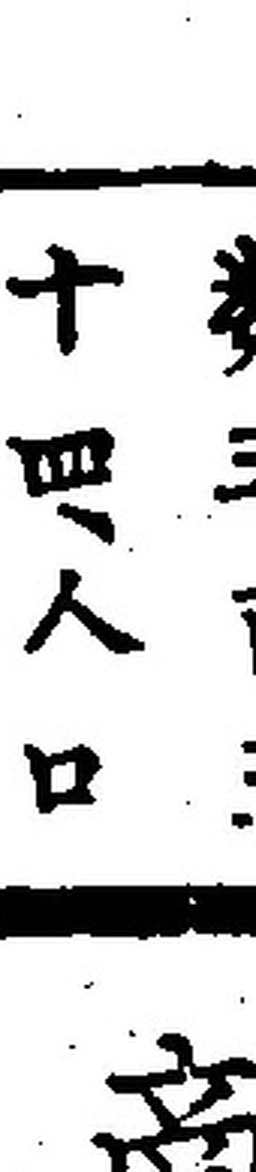十四、人口
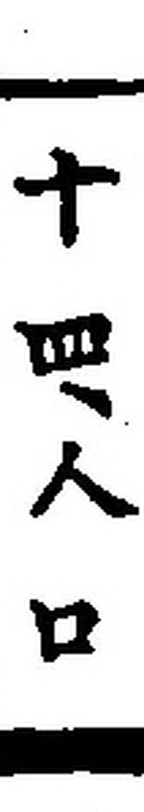十四、人口
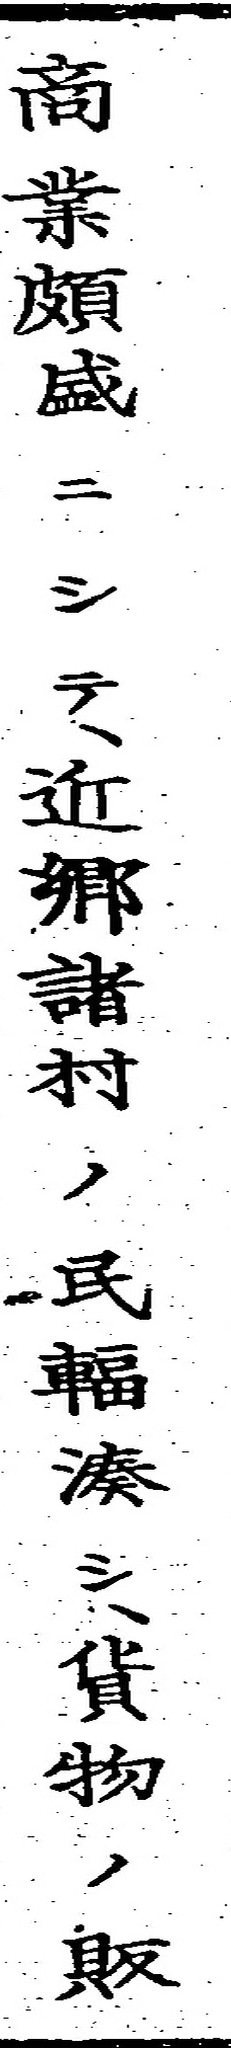商業頗盛ニシテ、近郷諸村ノ民輻湊シ、貨物ノ販
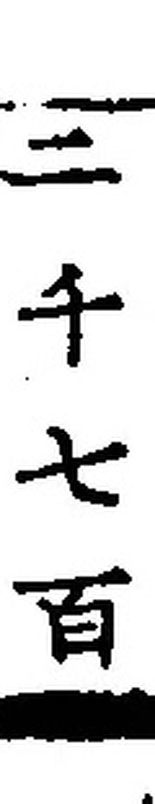二千七百
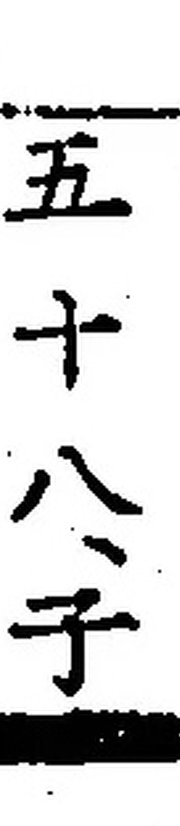五十八、子
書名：能登地誌略
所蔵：国立国会図書館 National Diet Library, JAPAN
